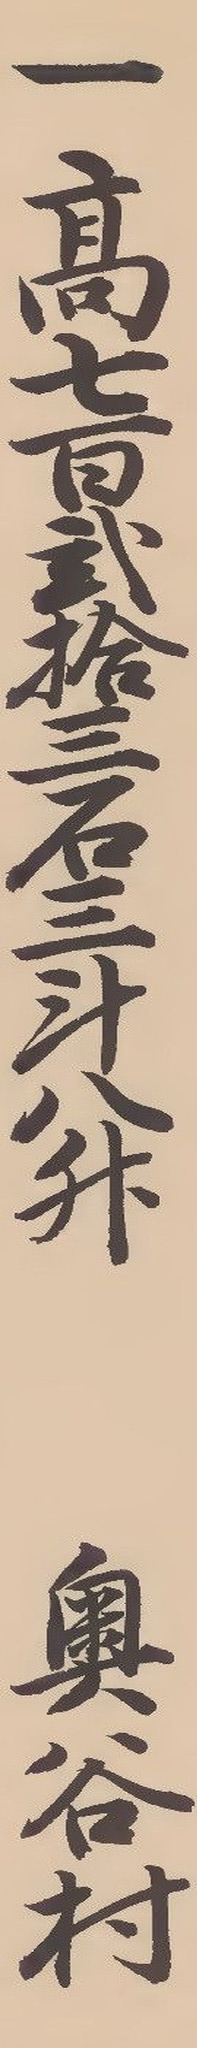一高七百弐拾三石三斗八升奥谷村
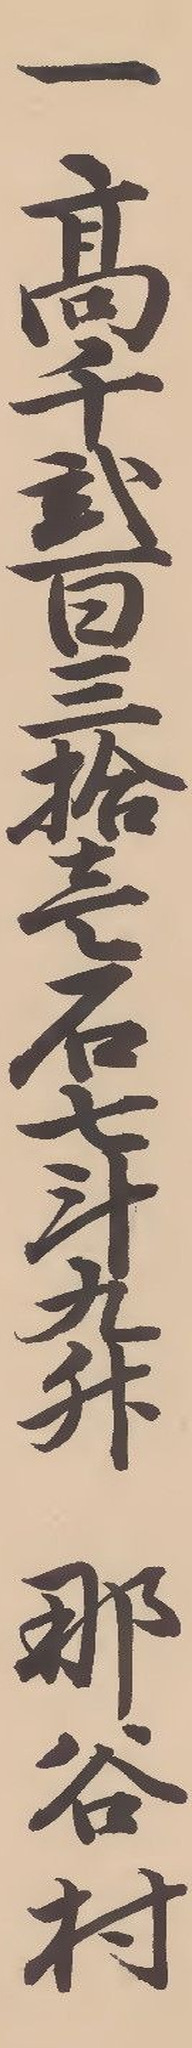一高千弐百三拾壱石七斗九升那谷村
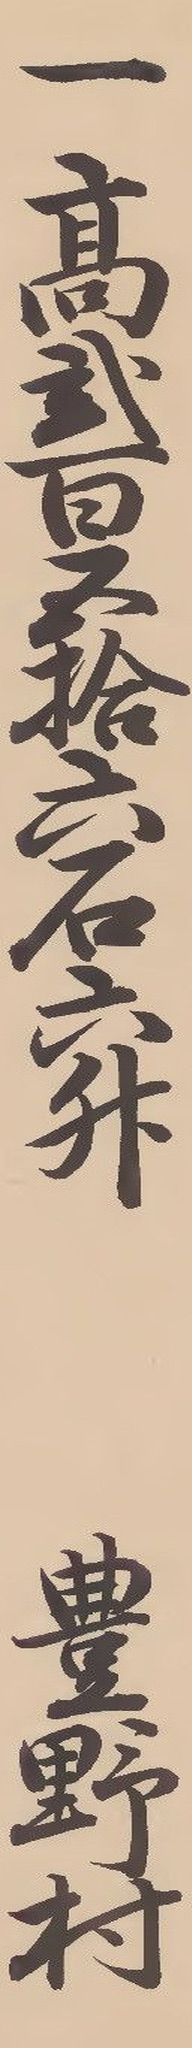一高弐百五拾六石六升豊野村
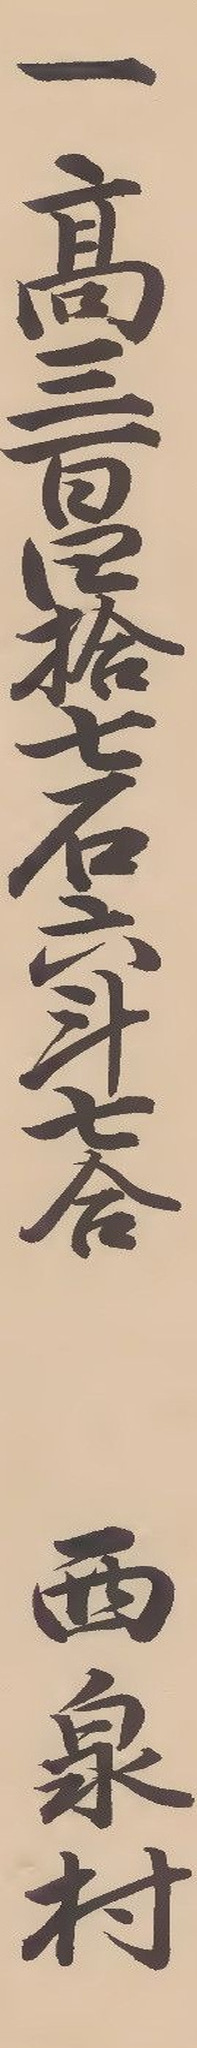一高三百四拾七石六斗七合西泉村
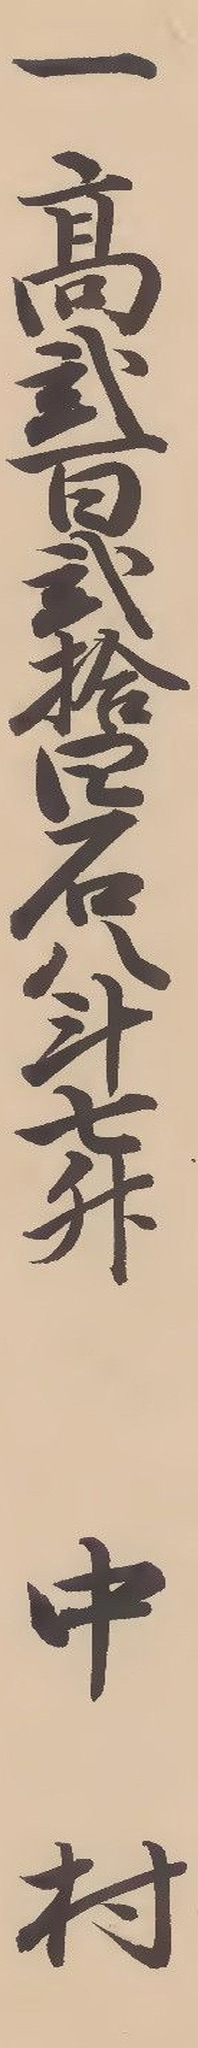一高弐百弐拾四石八斗七升中村
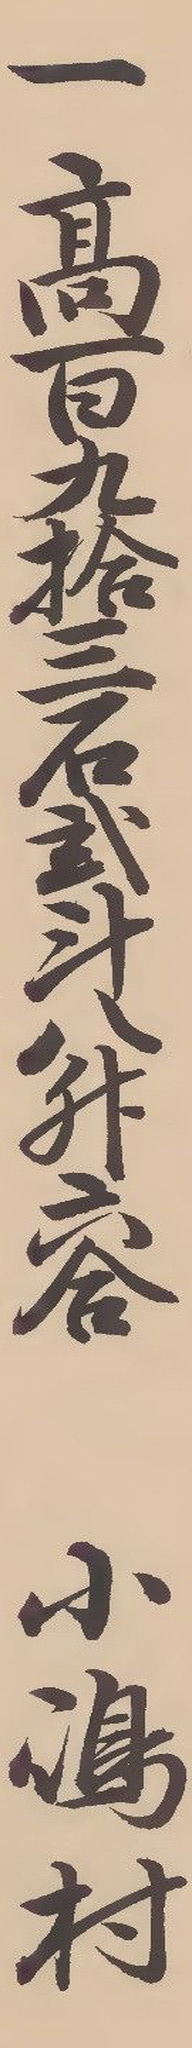一高百九拾三石弐斗八升六合小島村
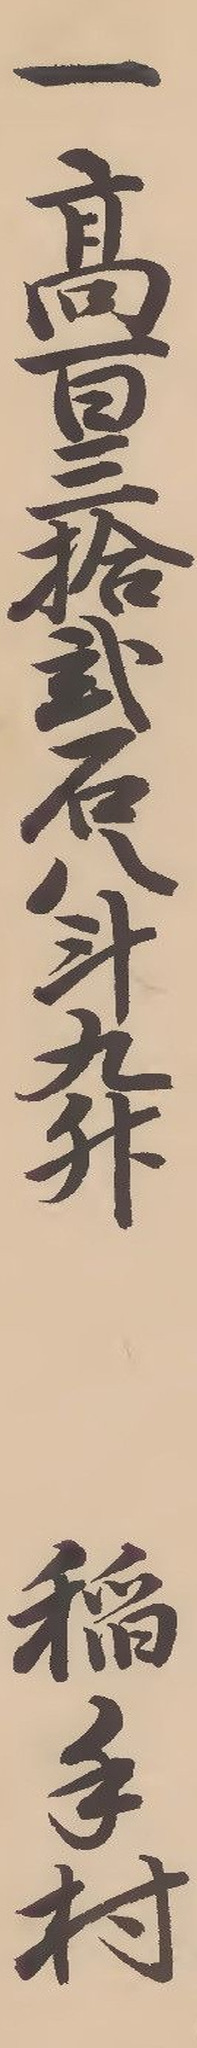一高百三拾弐石八斗九升稲手村

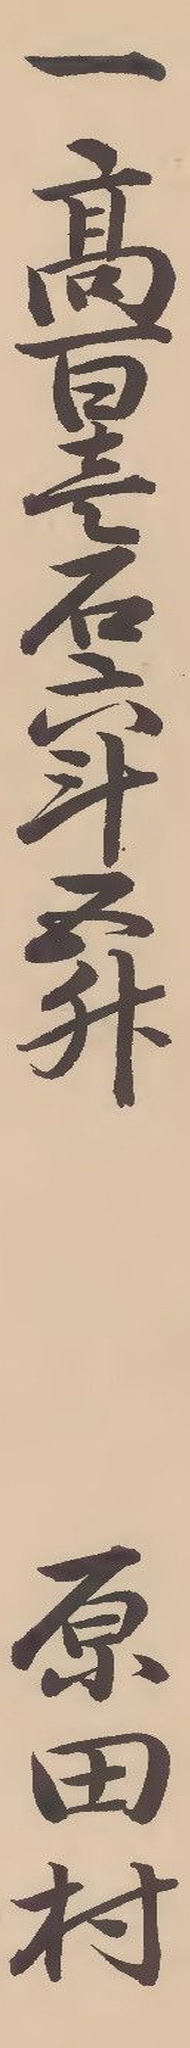一高百壱石六斗五升原田村
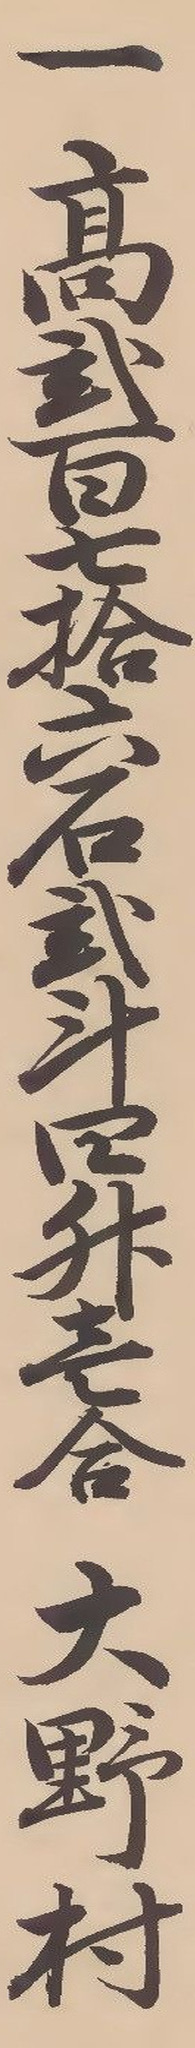一高弐百七拾六石弐斗四升壱合大野村
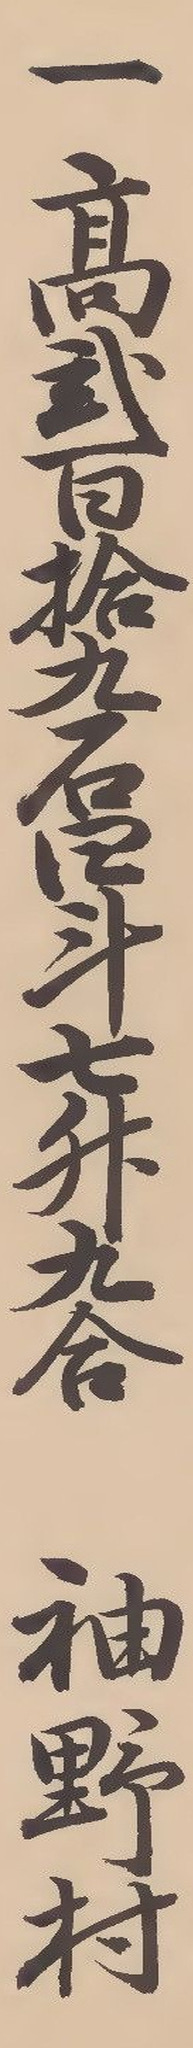一高弐百拾九石四斗七升九合袖野村
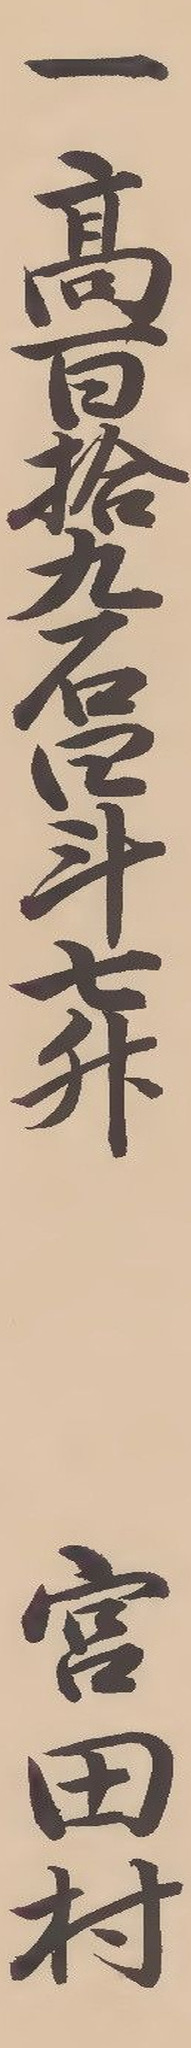一高百拾九石四斗七升宮田村
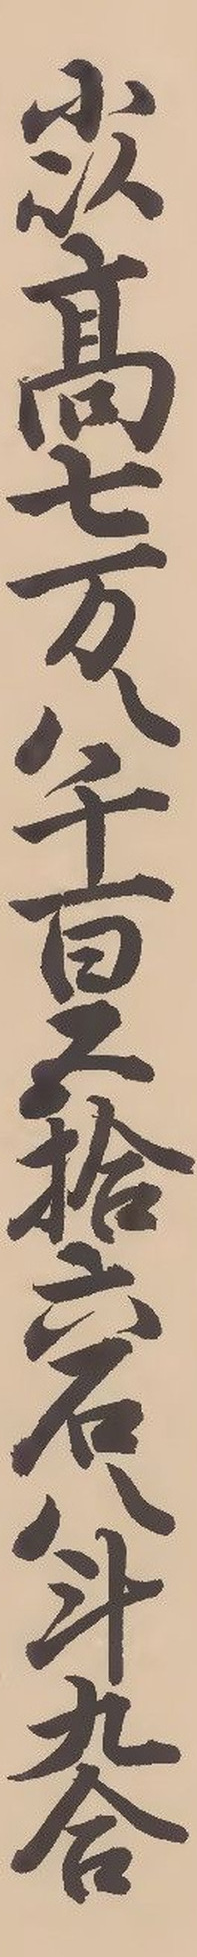小以高七万八千百五拾六石八斗九合
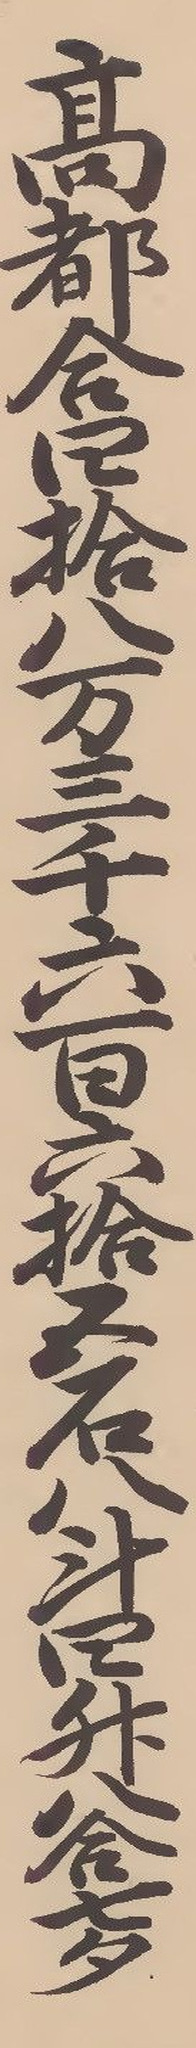高都合四拾八万三千六百六拾五石八斗四升八合七勺
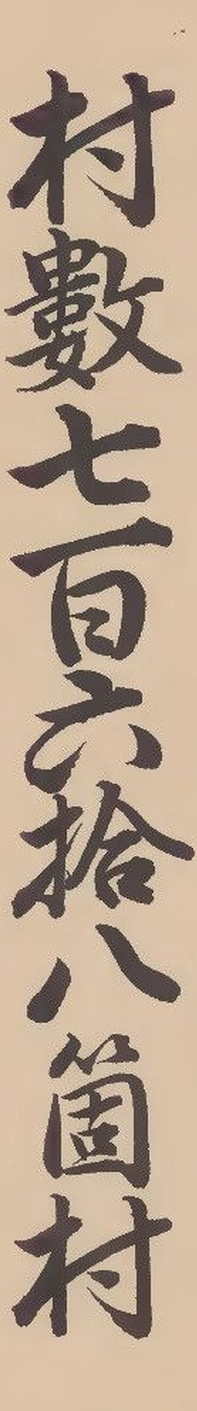村数七百六拾八箇村

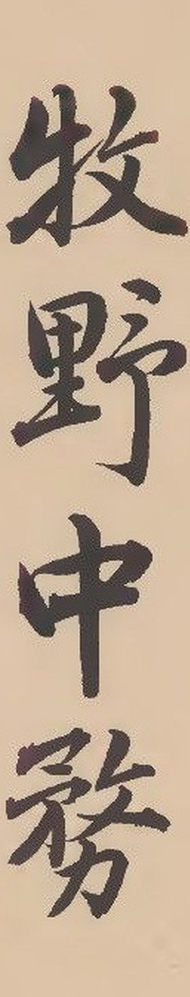牧野中務
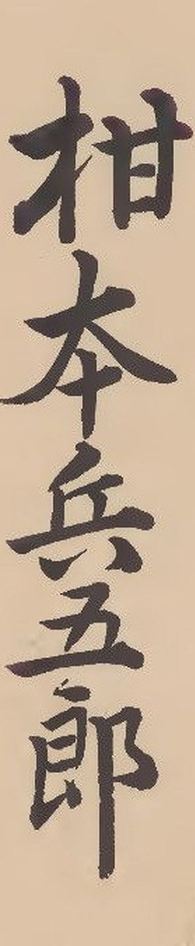柑本兵五郎
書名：加賀国郷帳
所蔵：国立公文書館 National Archives of Japan
